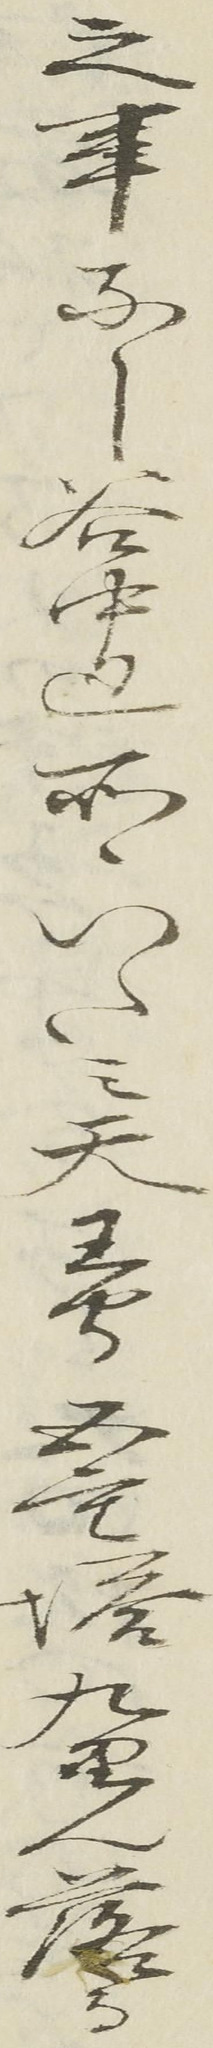之事なし谷中辺所〻いたミ天王寺五重塔九りん落る
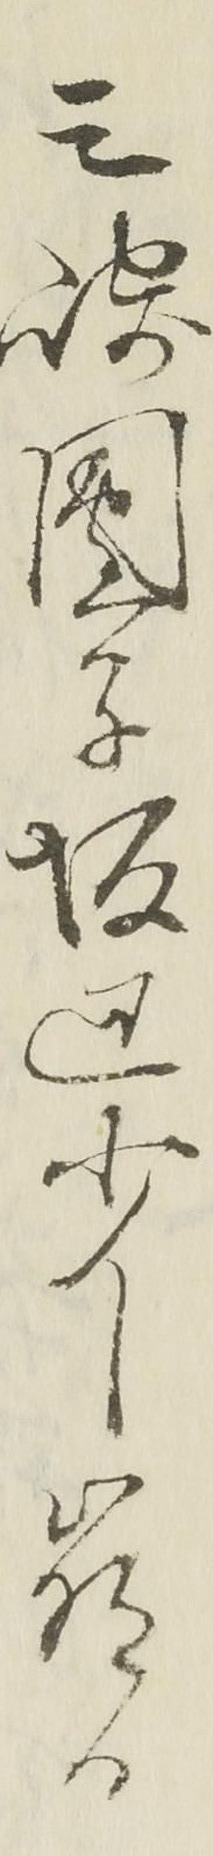三崎団子坂辺少し崩る
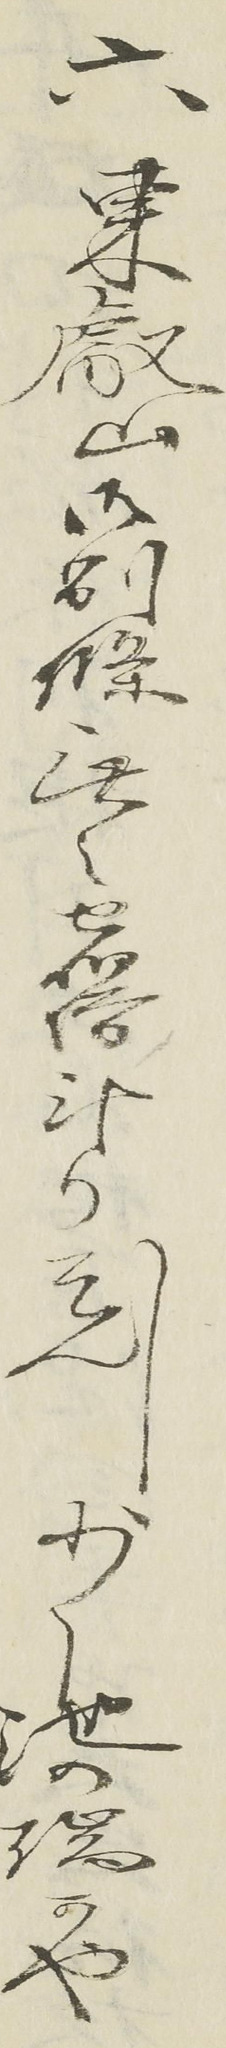六東叡山御別條無し宿坊計りそんし少し池の端かや
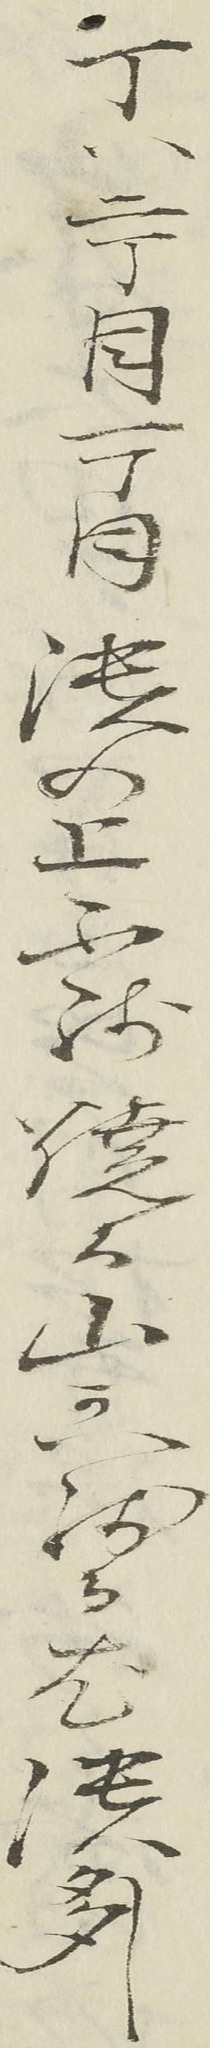丁ハ二丁目一丁目潰の上不残焼る山かハ残る尤潰多し
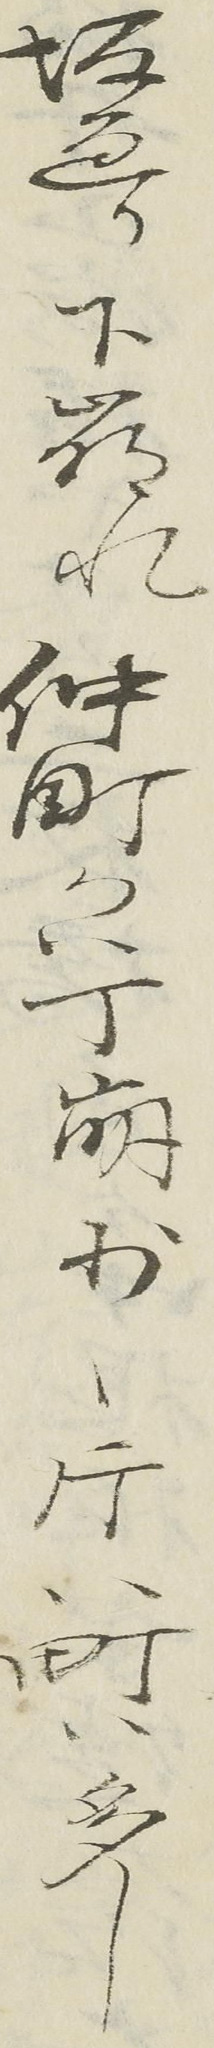坂通り下崩れ仲町かハ丁崩れ少し片ハ町ハ多し
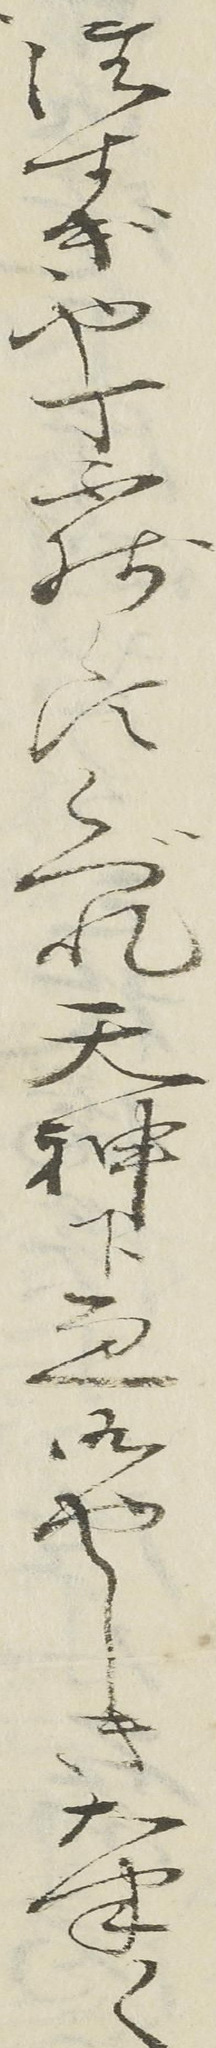御すぎや丁不残らすくづれ天神下通御やしき大半く
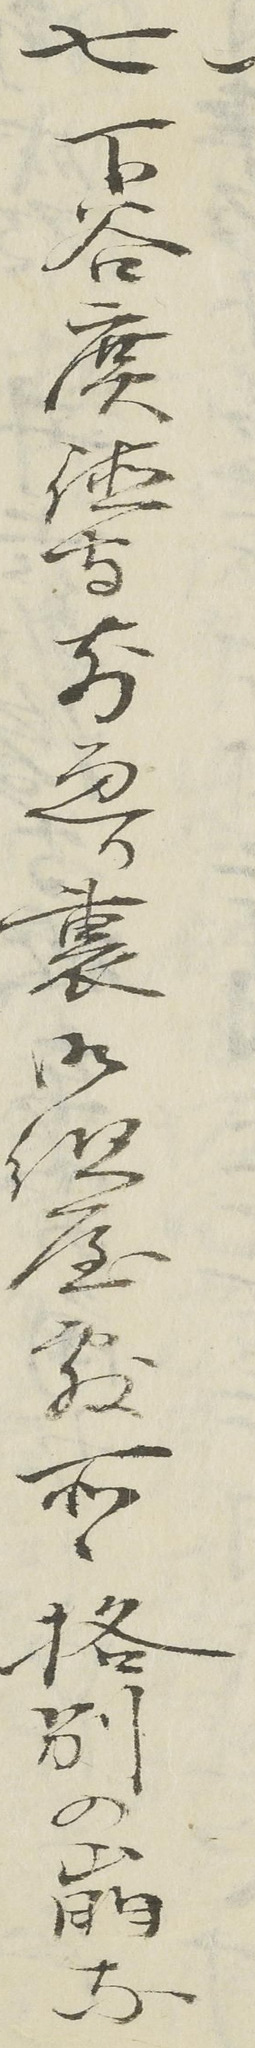七下谷廣徳寺前通り裏御組屋敷所〻格別の崩な
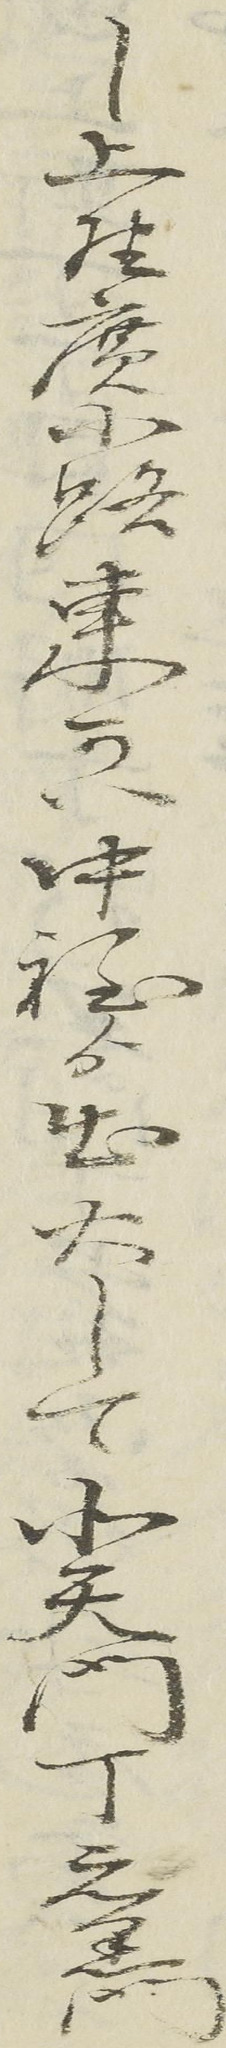し上野広小路東カハ中程ゟ出火して北天門丁元黒門

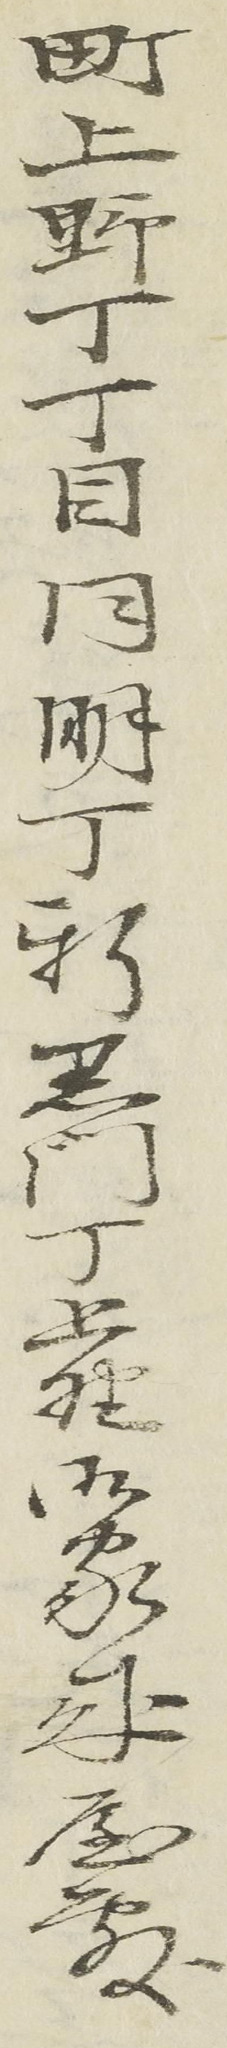町上野丁丁目同明丁新黒門丁上野御家来屋敷
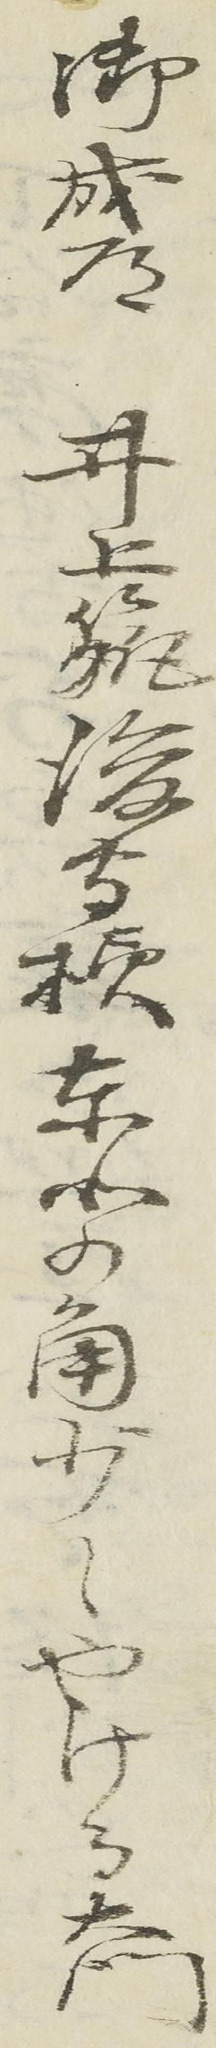御成道井上筑後守様東御の角少しやける大門
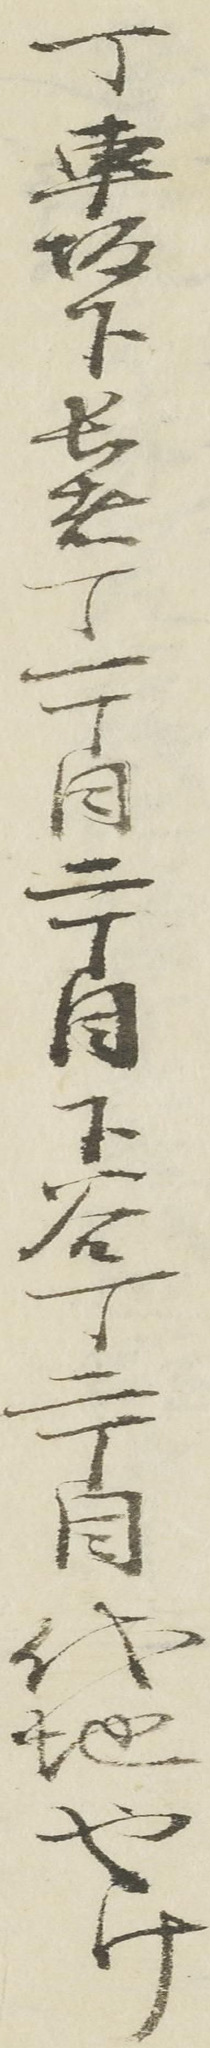丁車坂下長者丁一丁目二丁目下谷丁二丁目代地やけ
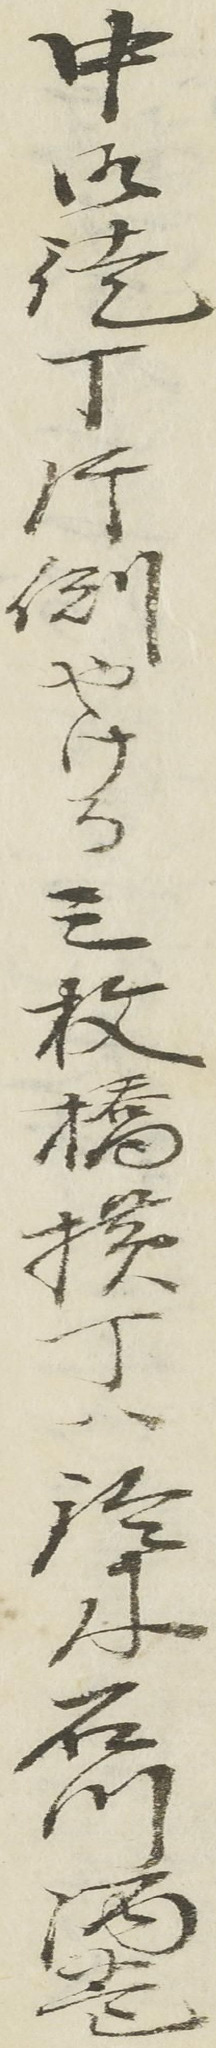中御徒丁片側やける三枚橋横丁ハ鈴木石川酒巻
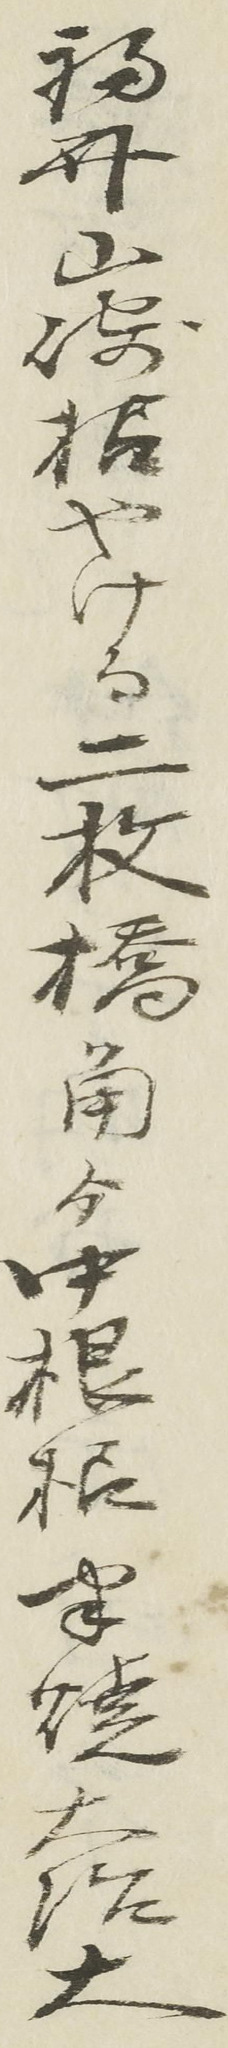福井山崎様やける二枚橋角ゟ中根様半焼大沼大
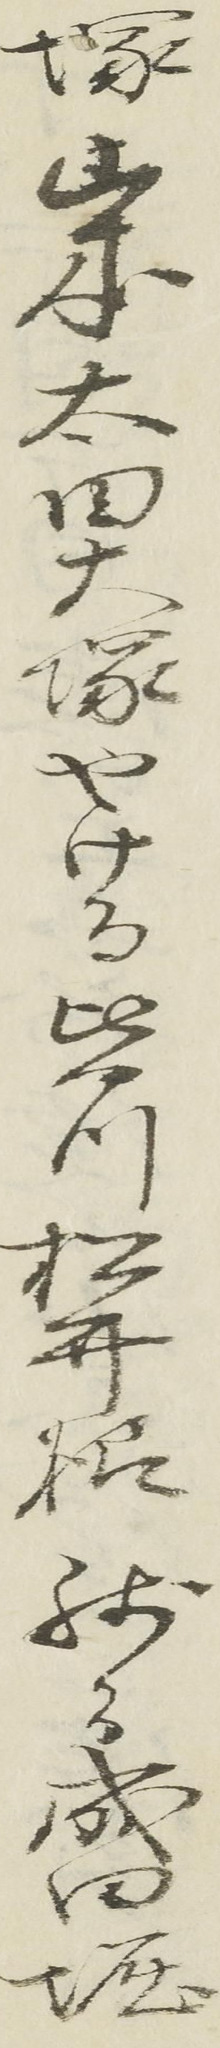塚山木太田大塚やける皆川松井様残り而成田堀
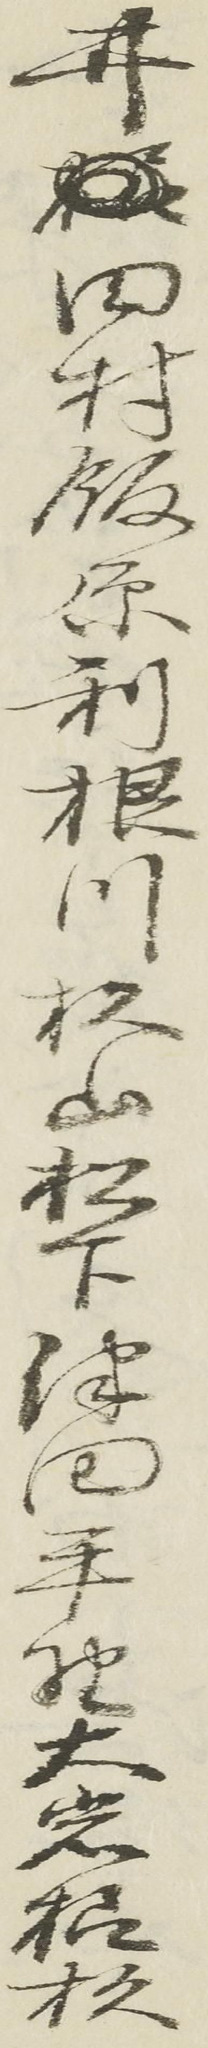井田村飯原利根川杉山松下津田平野大岩様杉
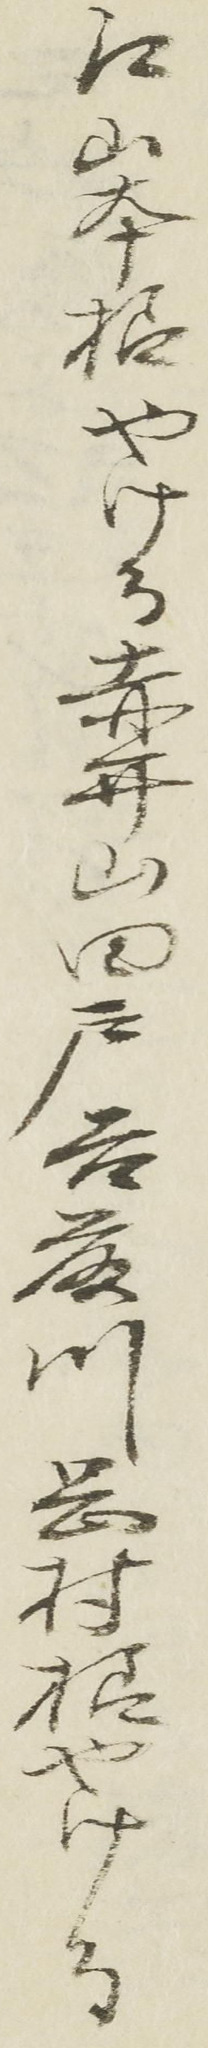江山本様やける赤井山田戸吉藤川岡村様やける
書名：安政乙卯江戸大地震筆記　安政丙辰八月大阪大雷雨之記追加　安政三辰年七月松前辺大地震并八月大風雨記録
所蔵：東京大学地震研究所図書室 Earthquake Research Institute Library, The University of Tokyo, JAPAN
